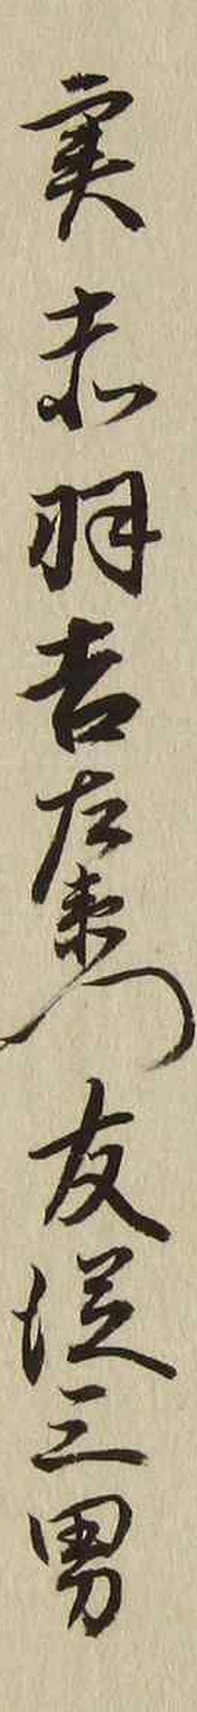実赤羽吉左衛門友従三男
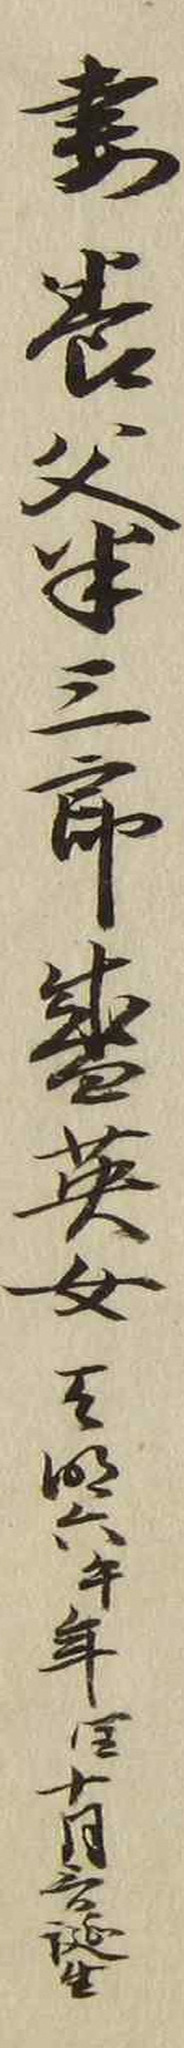妻養父半三郎盛英女天明六午年閏十月三日誕生

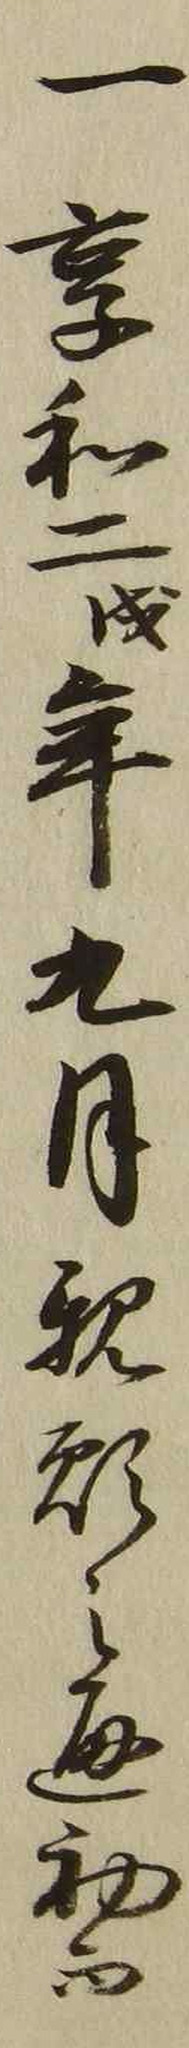一享和二戌年九月親願之通初而
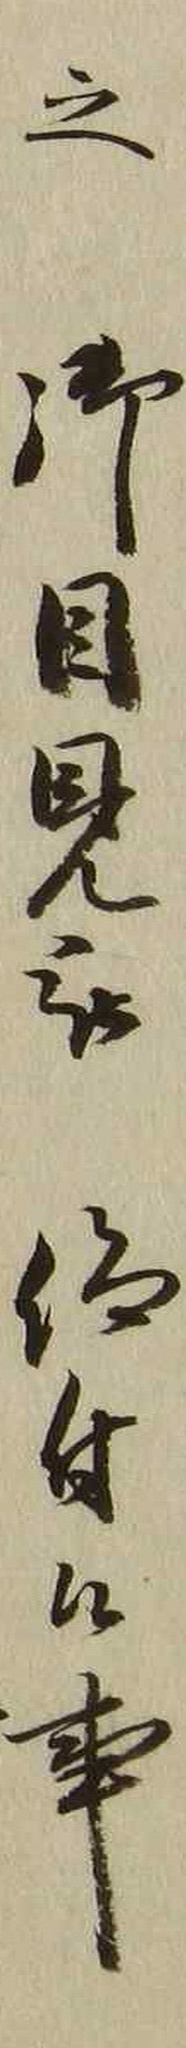之御目見被仰付候事
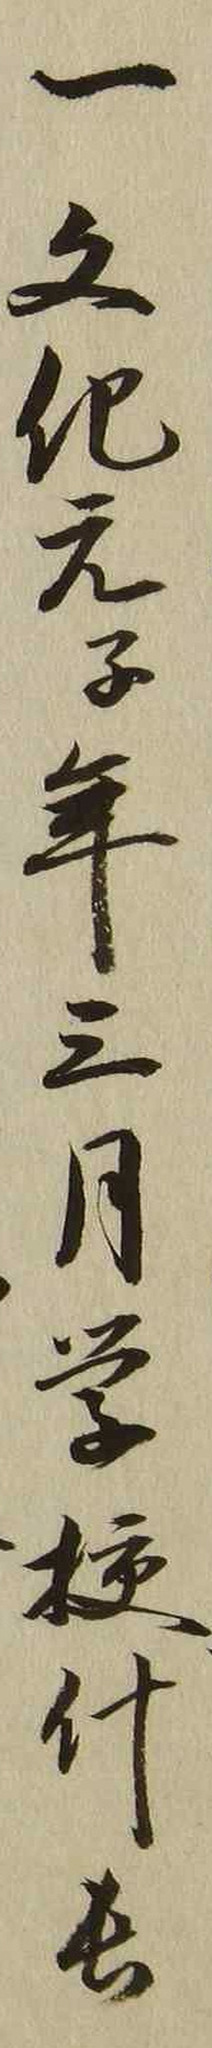一文化元子年三月学校什長
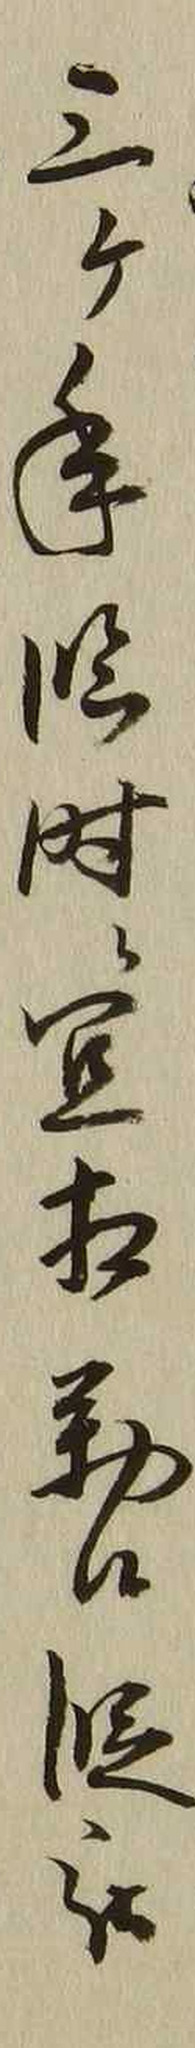三ヶ年臨時ニ宜相勤候段被
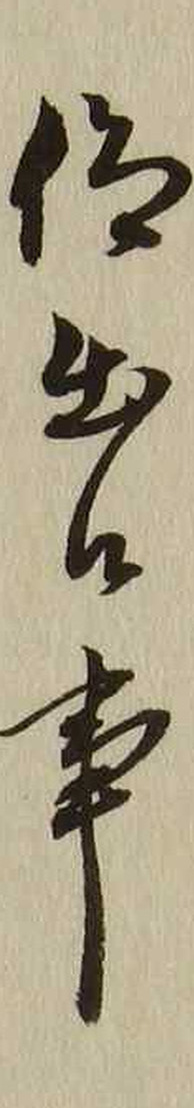仰出候事
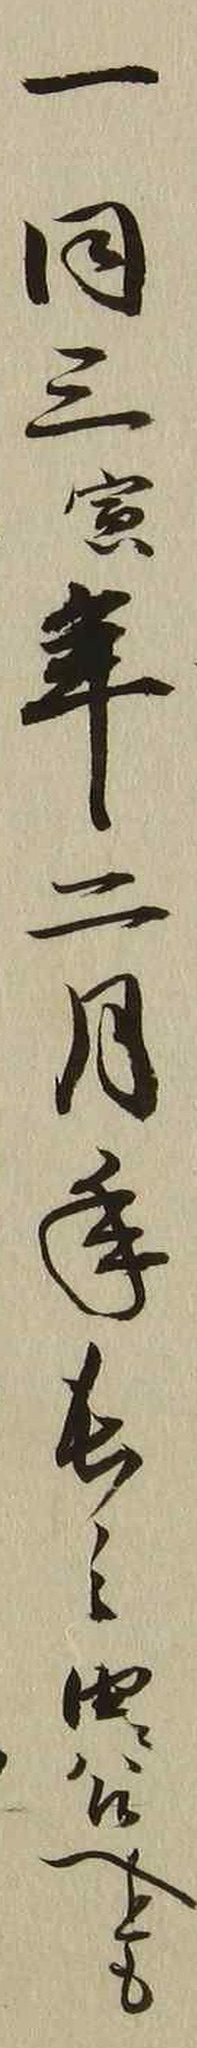一同三寅年二月年長之由ニハ候へとも
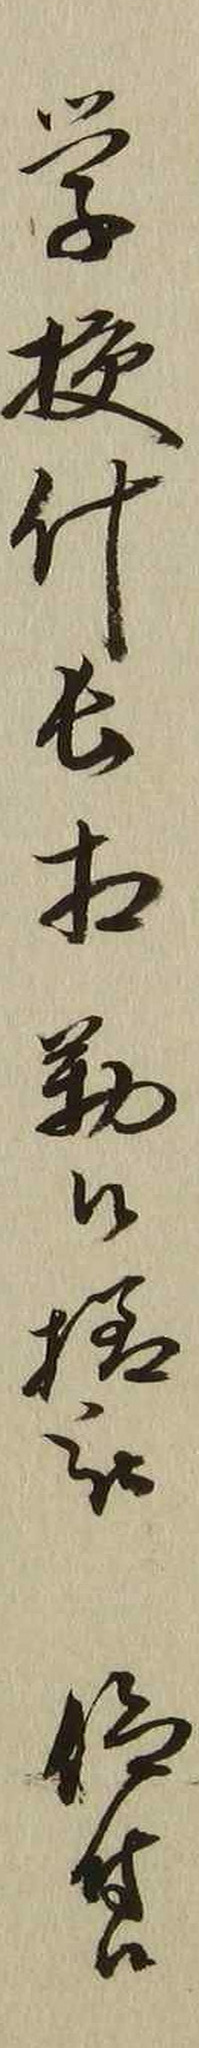学校什長相勤候様被仰付候
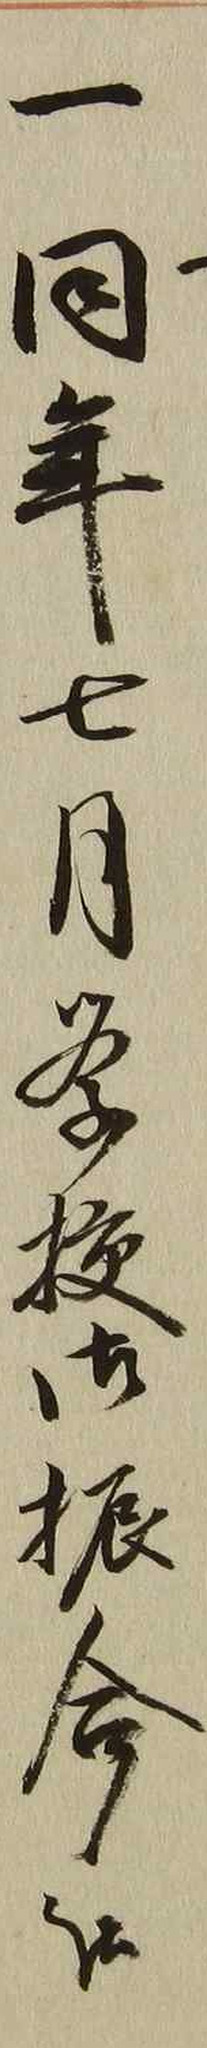一同年七月学校御振合被
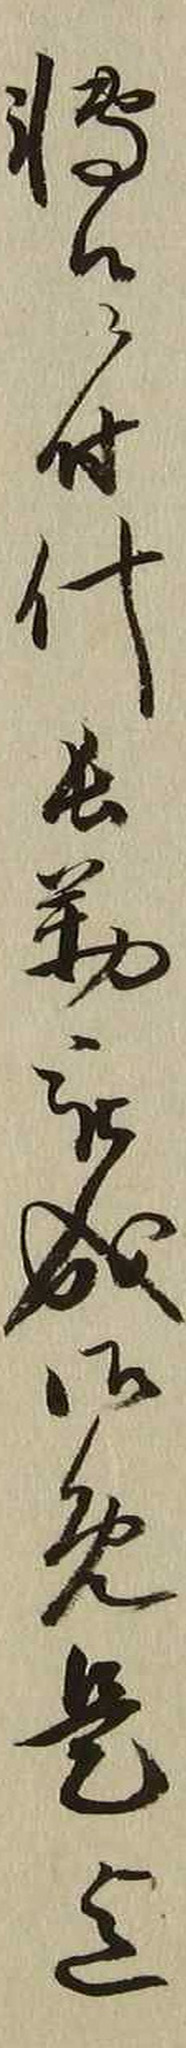転候ニ付什長勤被成御免是迄
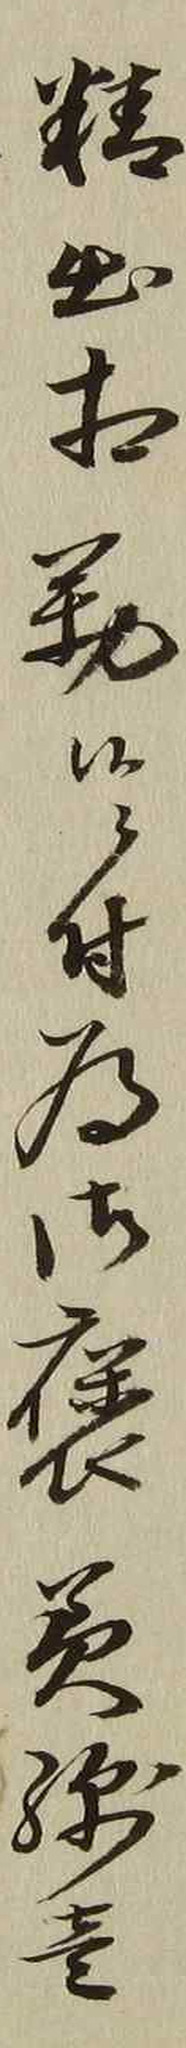精出相勤候ニ付為御褒美綿壱
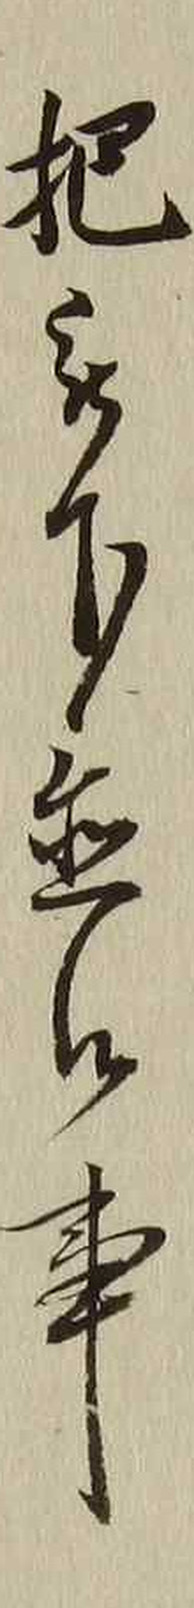把被下置候事
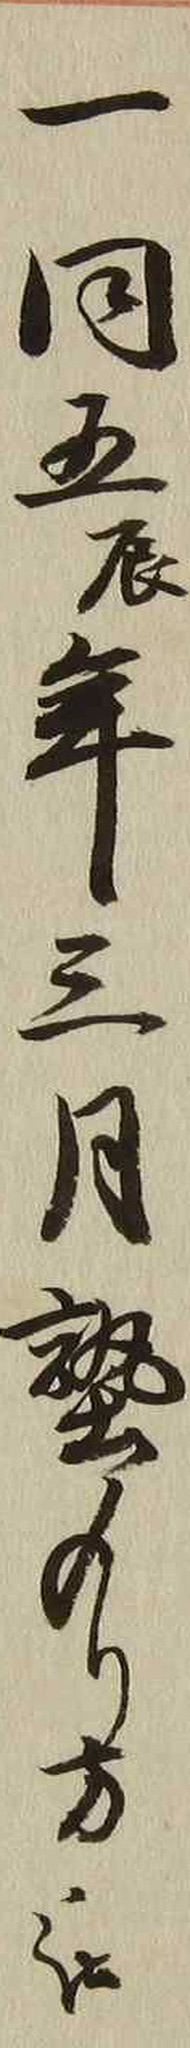一同五辰年三月塾〆り方被
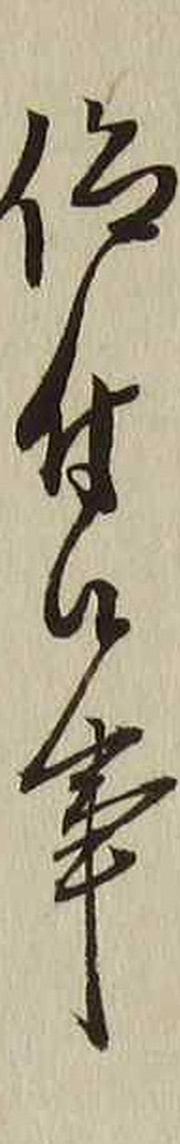仰付候事
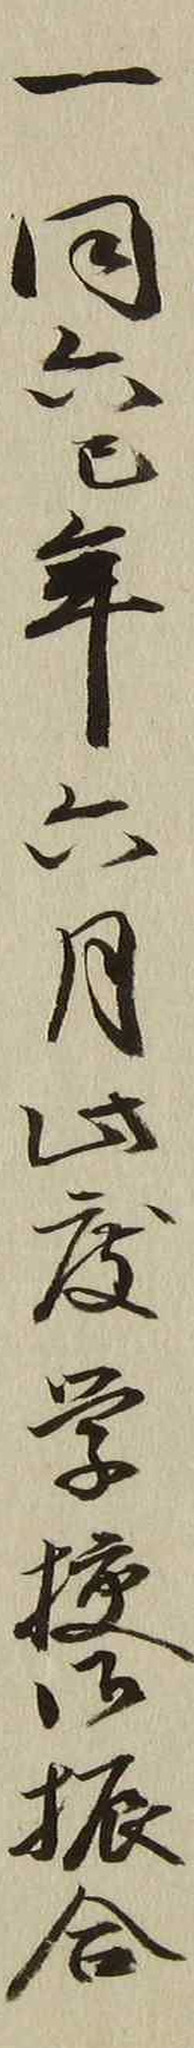一同六巳年六月此度学校御振合
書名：諸士系譜　巻之61　と之部4
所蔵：会津若松市立会津図書館
